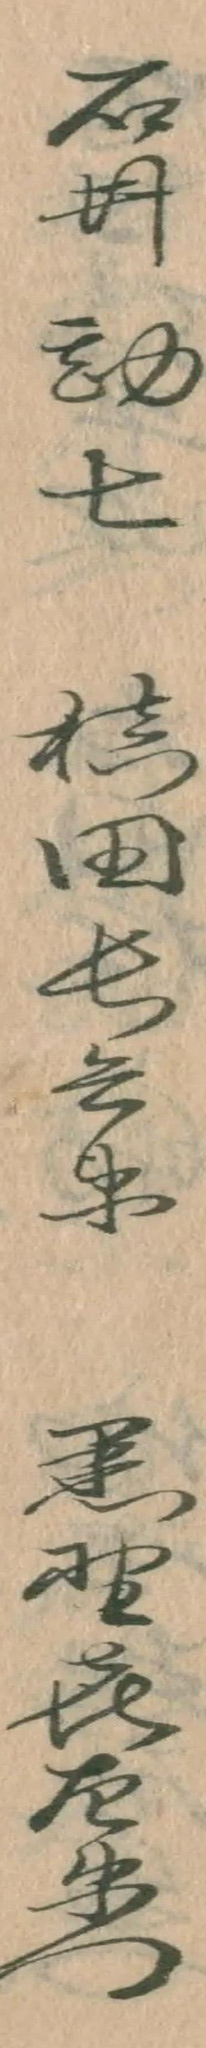石井勘七槙田長兵衛黒野喜左衛門
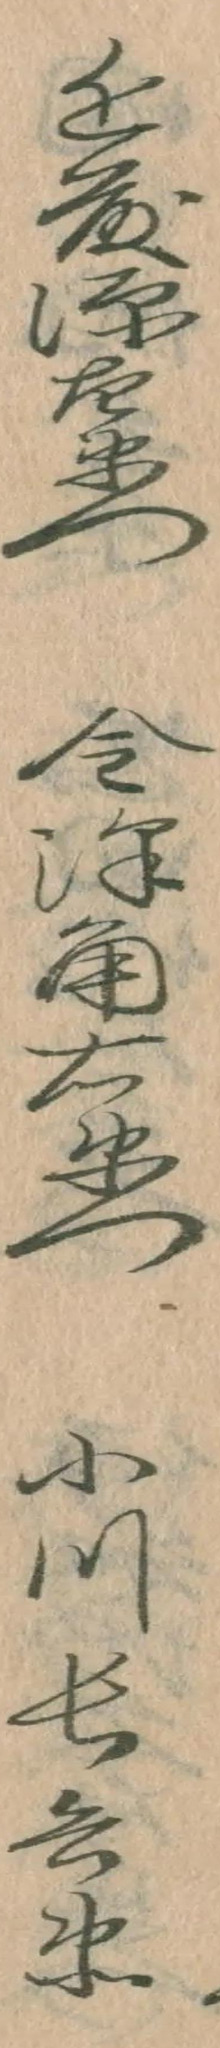近藤源左衛門金沢角右衛門小川長兵衛
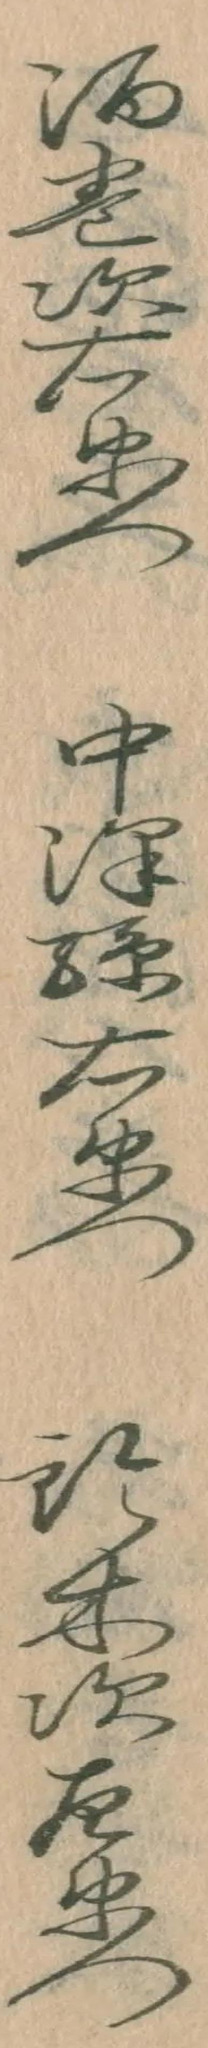酒巻次右衛門中津孫右衛門鈴木次左衛門
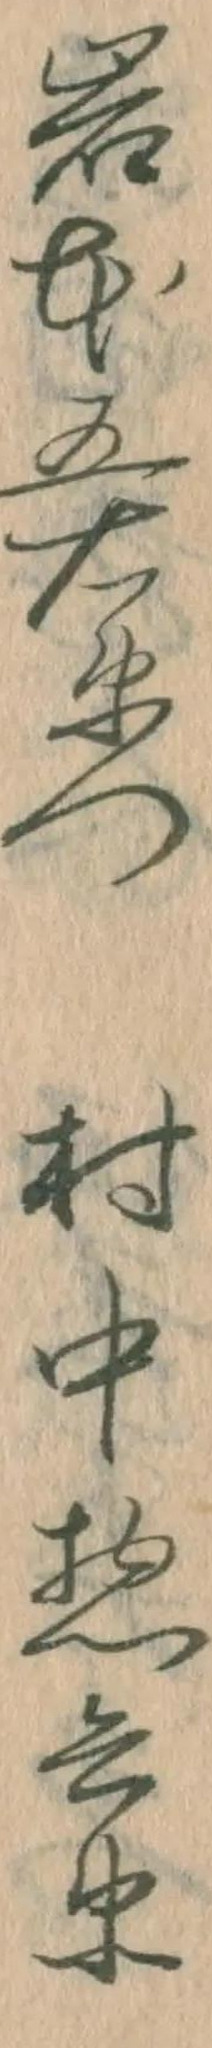岩本五右衛門村中惣兵衛
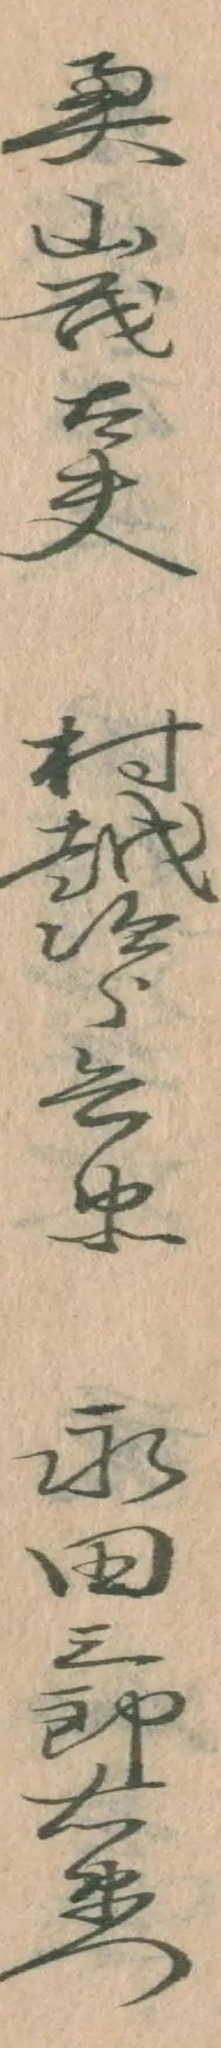奥山茂太夫村越次郎兵衛永田三郎右衛門
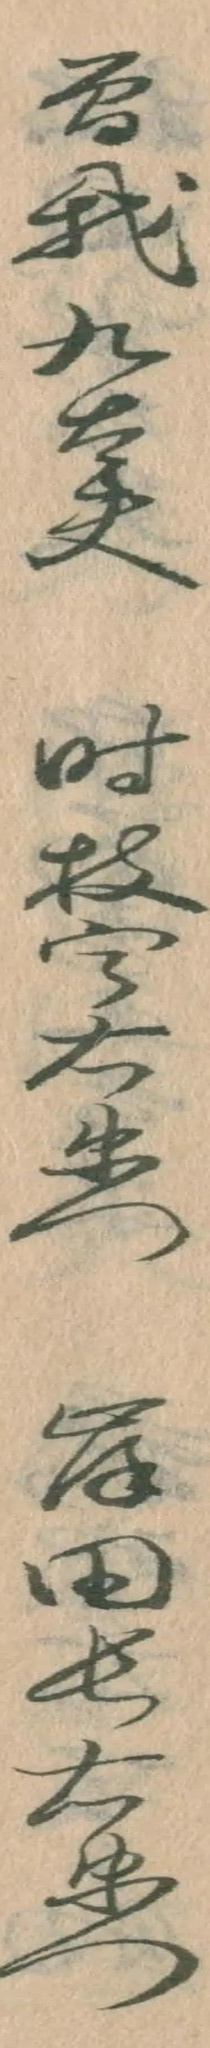曽我九太夫時枝宇右衛門岸田長右衛門
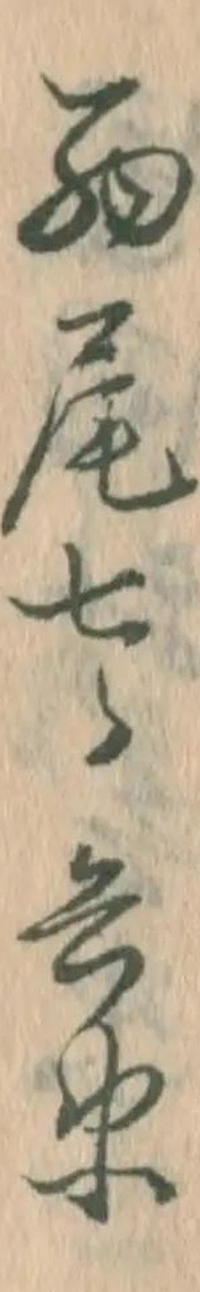西尾七郎兵衛
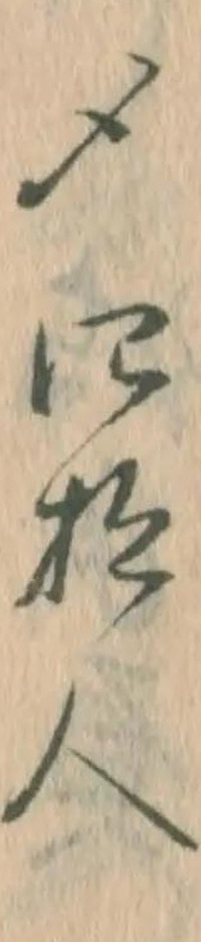〆四拾人

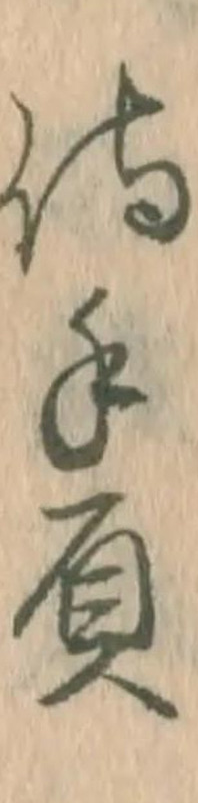侍手負
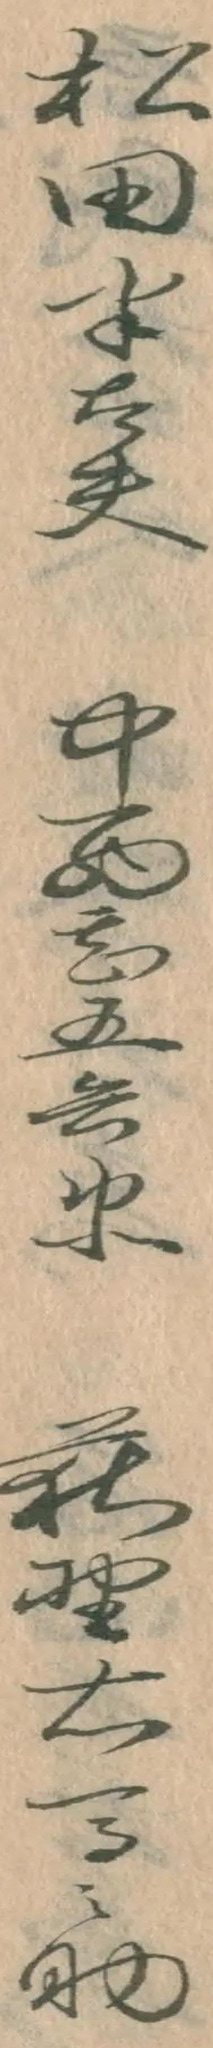松田半太夫中西甚五兵衛荻野右馬之助
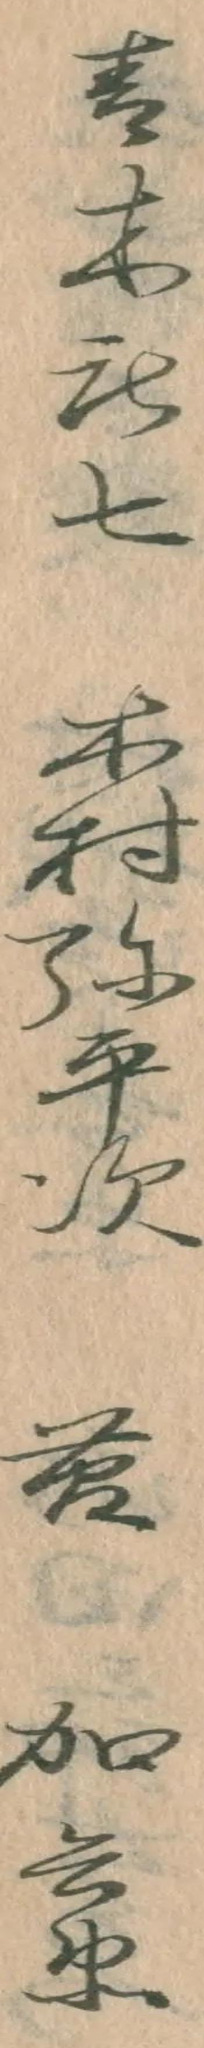青木庄七木村弥平次菅加兵衛
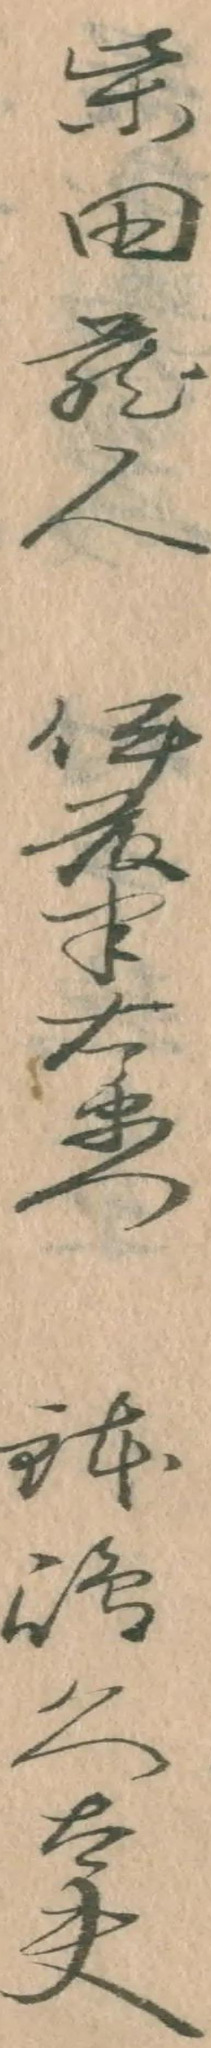柴田蔵人伊藤半右衛門鉢島久太夫
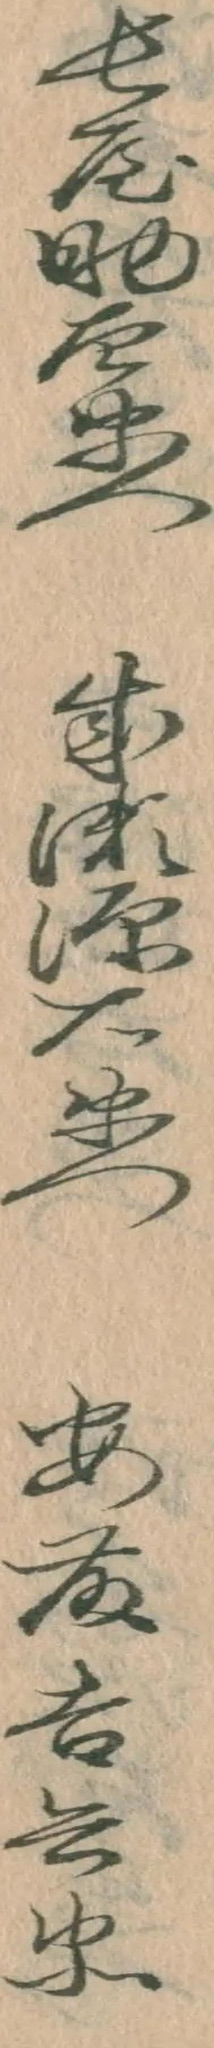長屋助左衛門成瀬源右衛門安藤吉兵衛
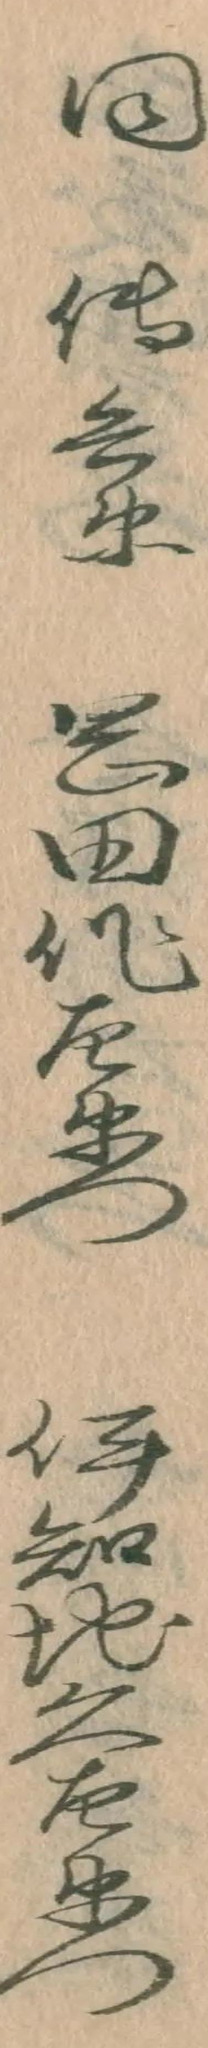同伝兵衛岡田作左衛門伊知地久左衛門
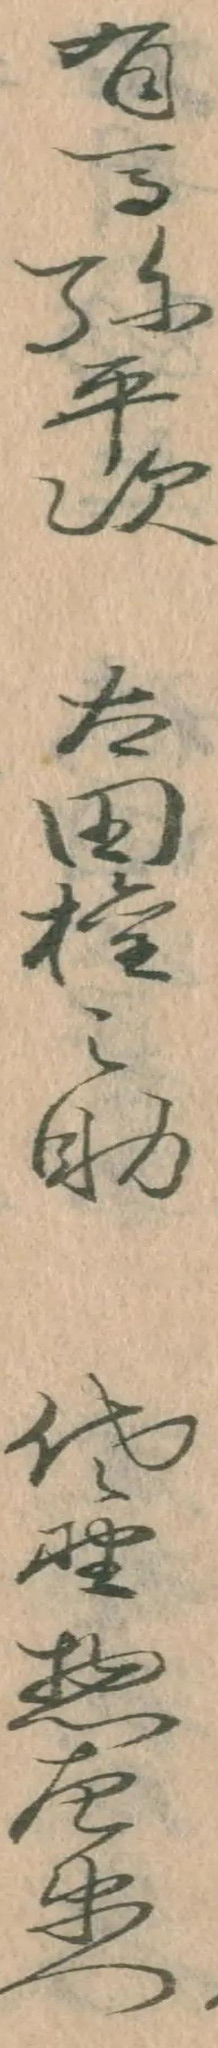有馬弥平次太田権之助佐野惣左衛門
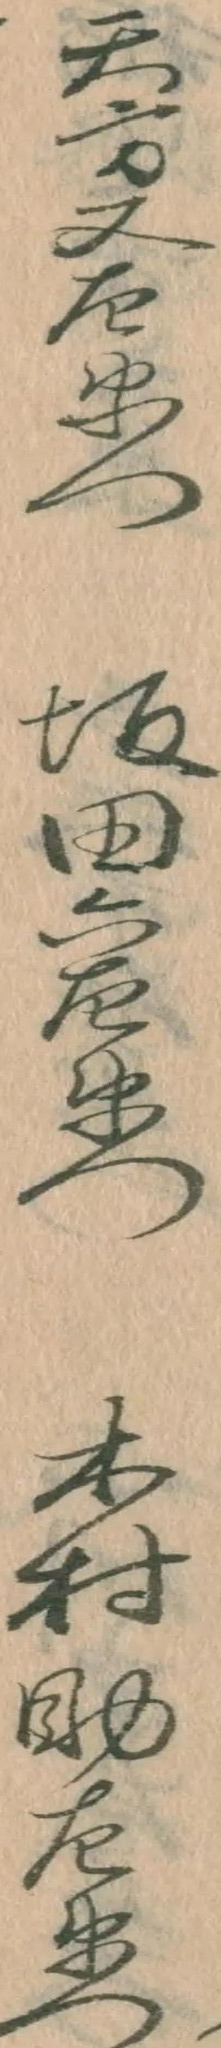天方又左衛門坂田六左衛門木村助左衛門
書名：切支丹御退治記 49巻. [9]
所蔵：国立国会図書館 National Diet Library, JAPAN
